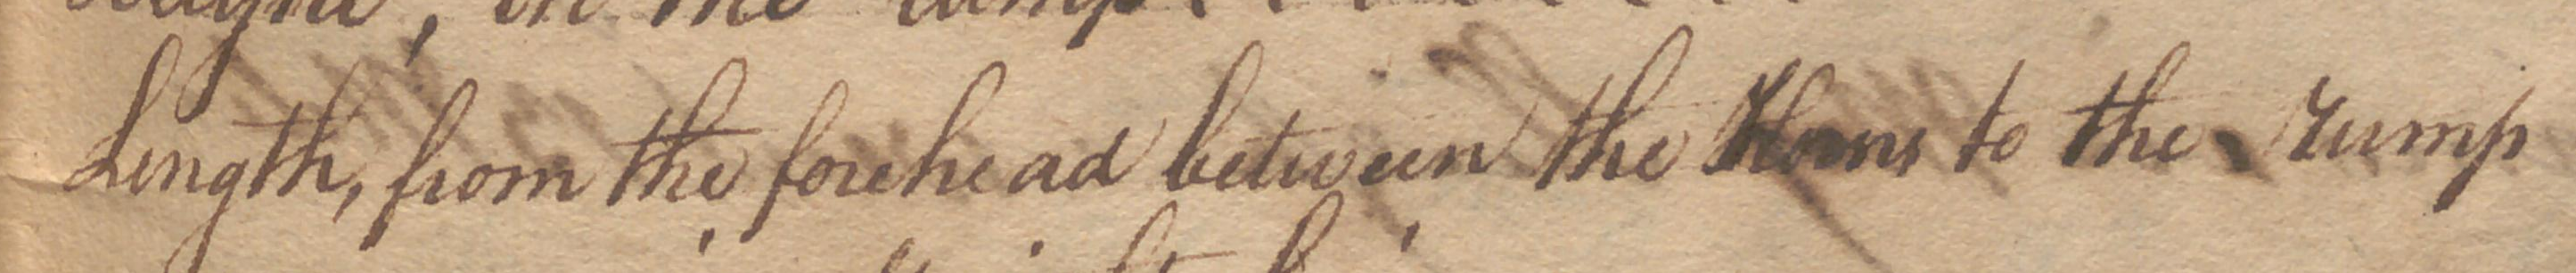Length, from the forehead between the Horns to the rump
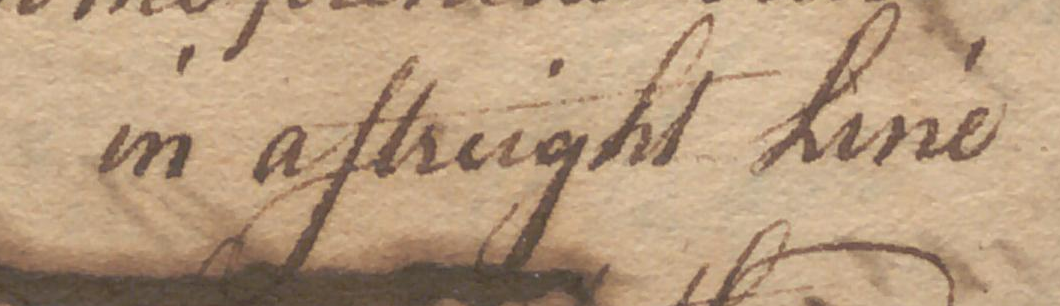in a straight Line
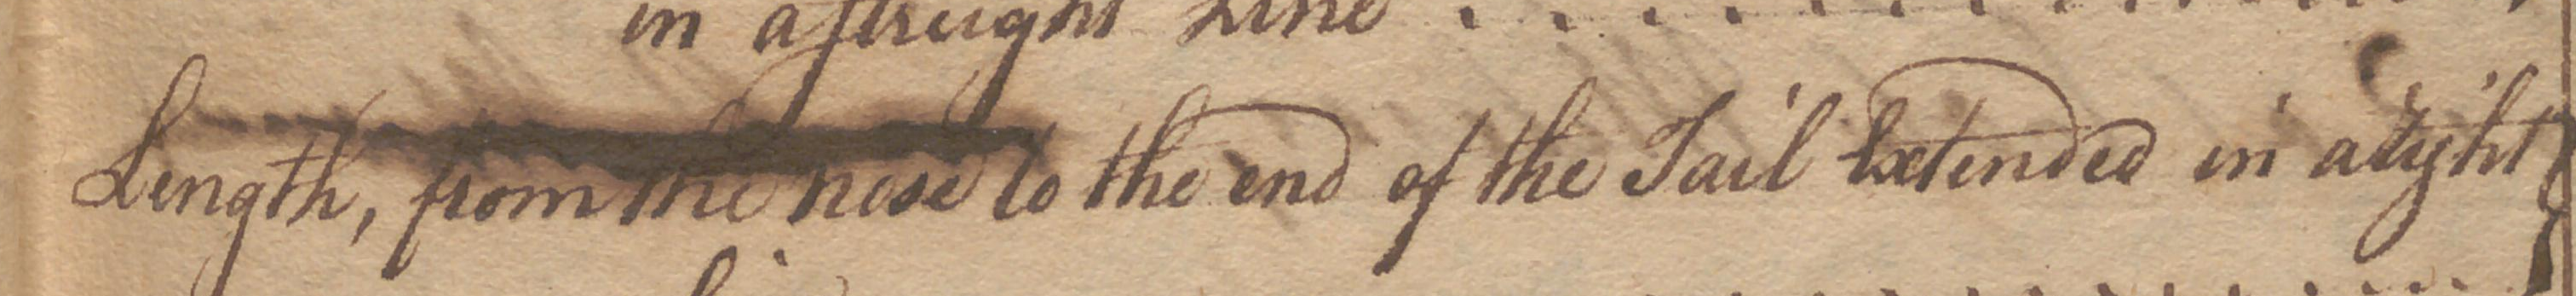Length, from the nose to the end of the Tail Extended in a right
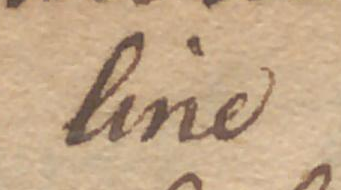line
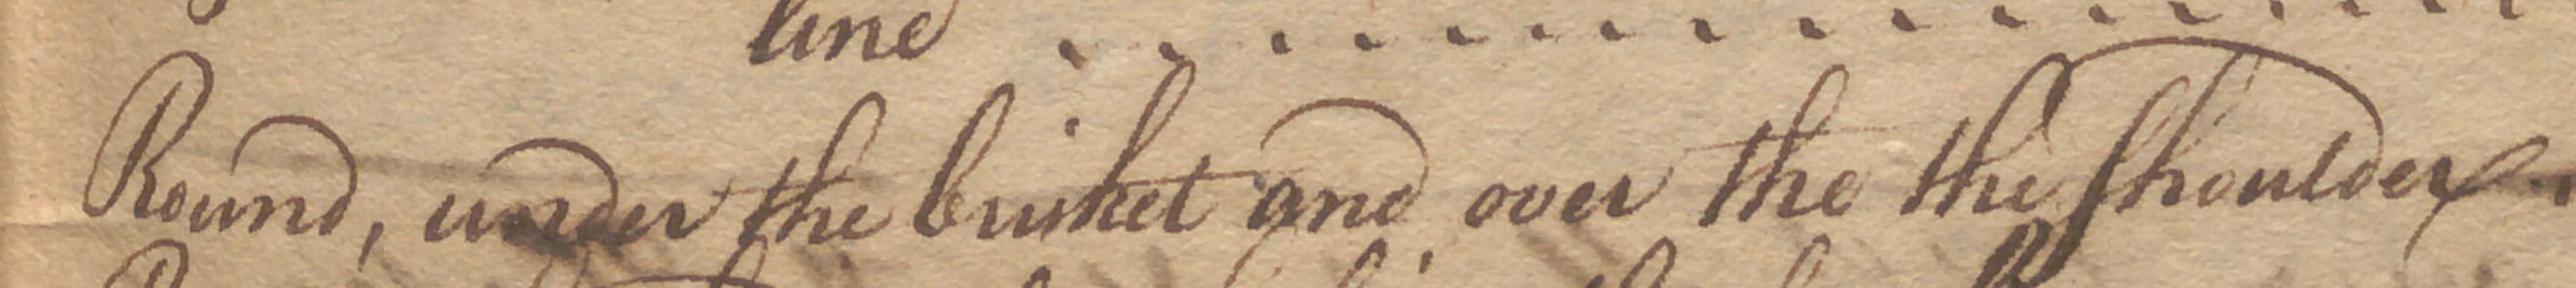Round, under the brisket and over the the shoulder
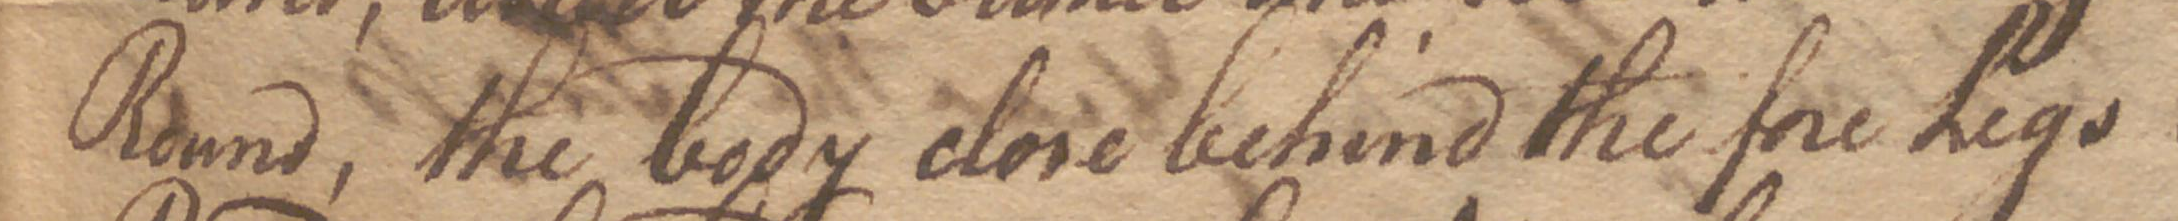Round, the body close behend the fore Legs
